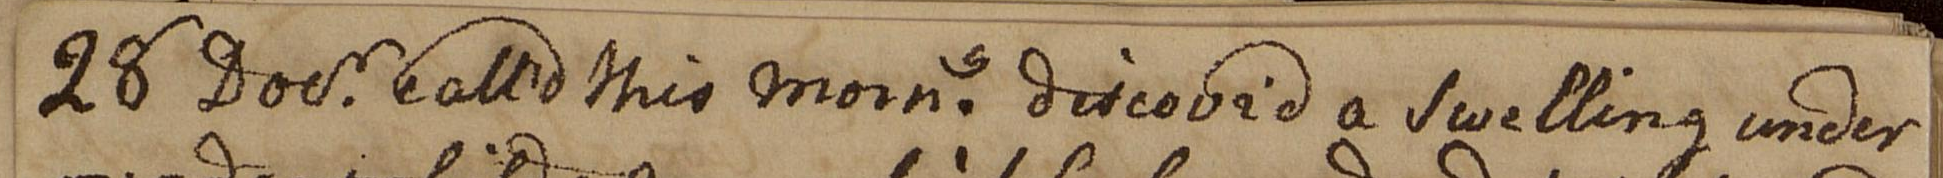28 Doc^r. call'd this morn^g. discovr'd a Swelling under
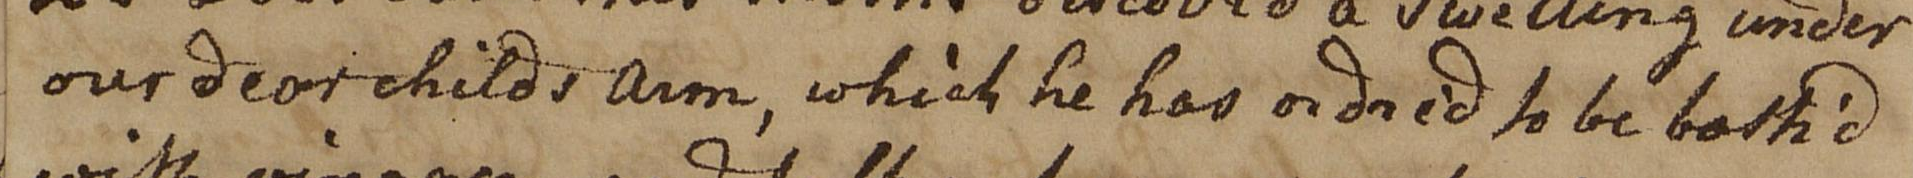our dear childs arm, which he has order'd to be bath'd
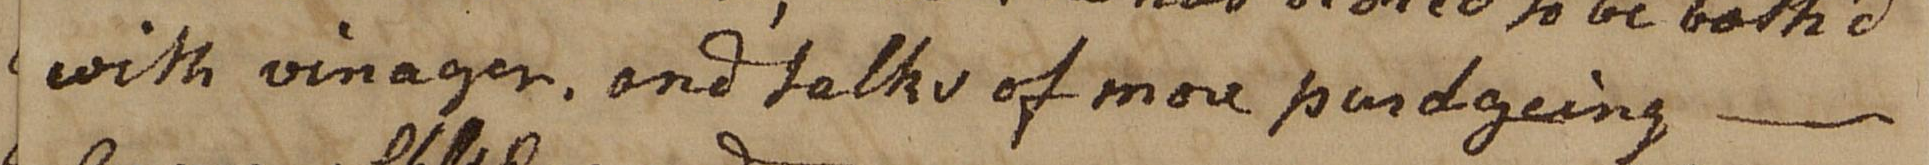with vinager, and talks of more purdgeing-
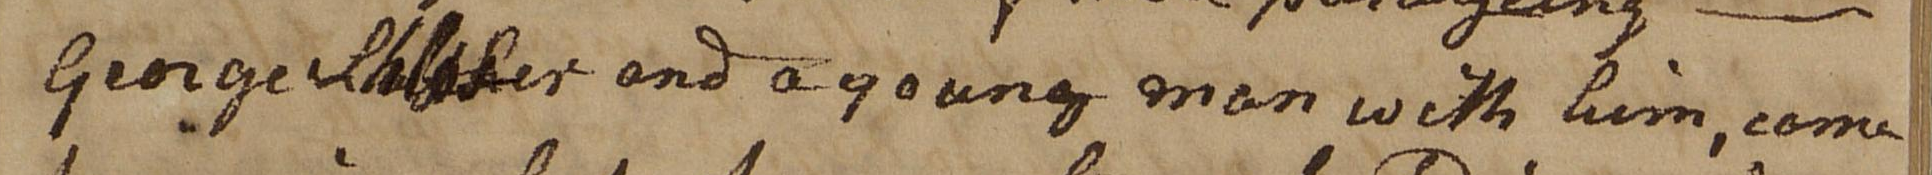George [______] and a young man with him, come
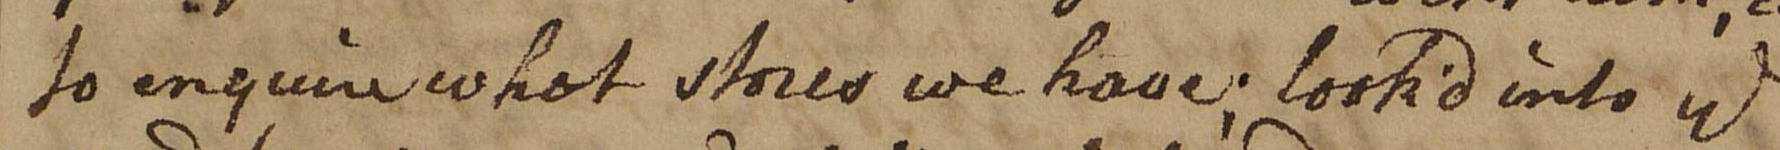to enquire what stores we have; look'd into y^e
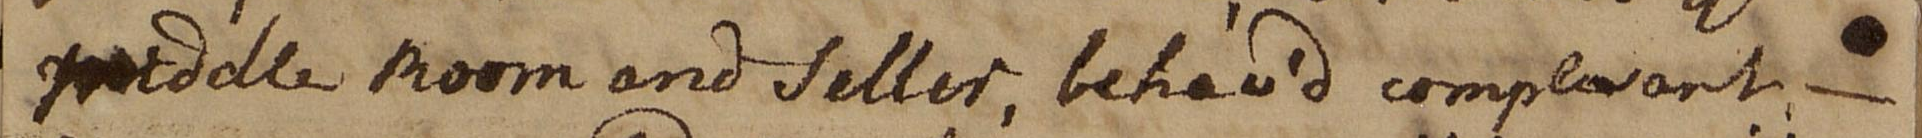middle Room and Seller, behav'd complasant-
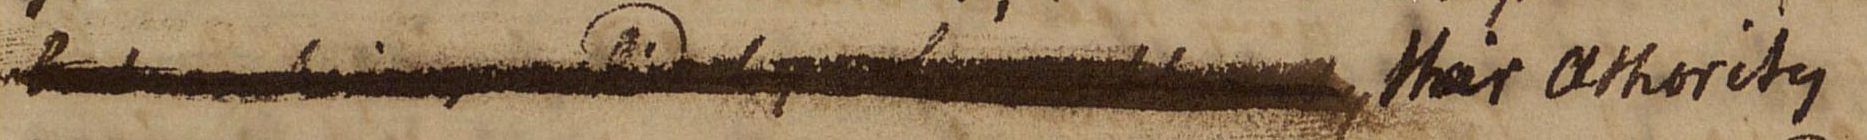[______________] their athority
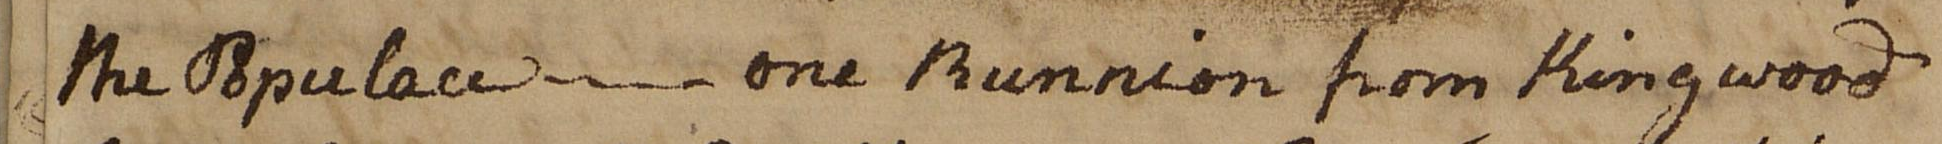the Populace- one Runnion from King wood
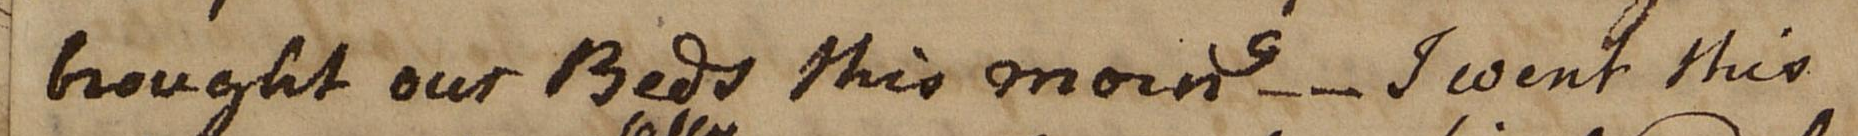brought our Beds this morn^g-- I went this
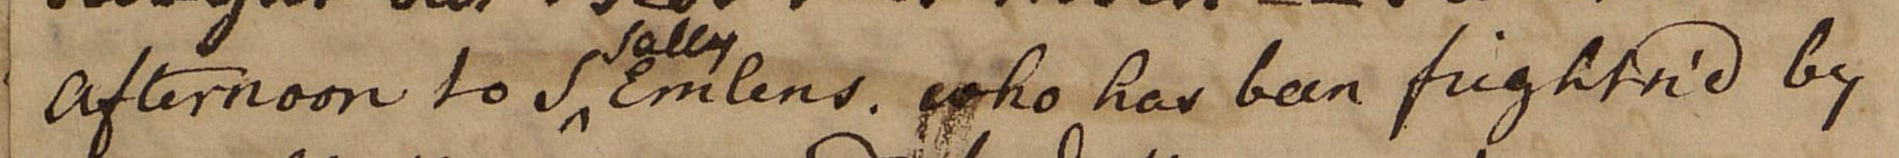Afternoon to S ^ Emlens. who has been frightn'd by
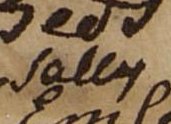Sally
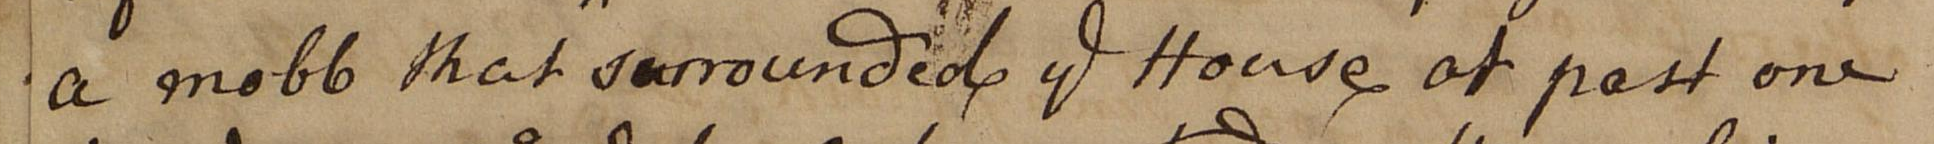a mobb that surrounded y^e House at past one
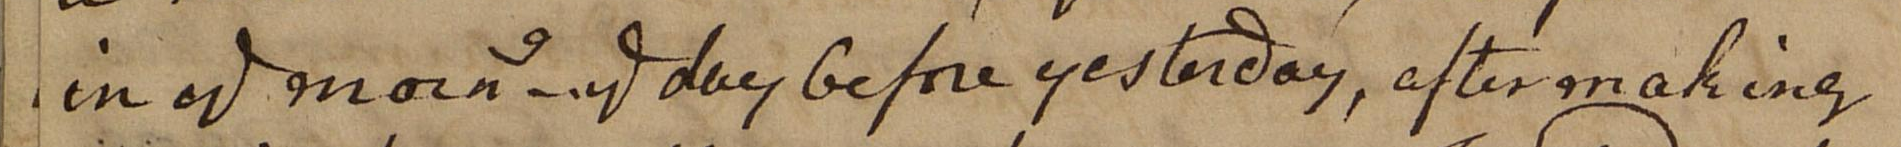in y^e morn^g- y^e day before yesterday, after making
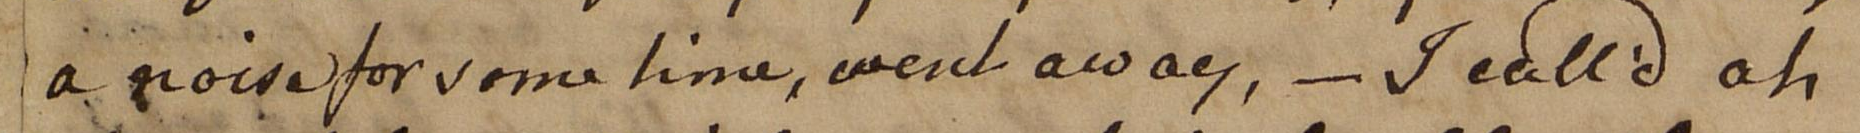a noise for some time, vent away,- I call'd at
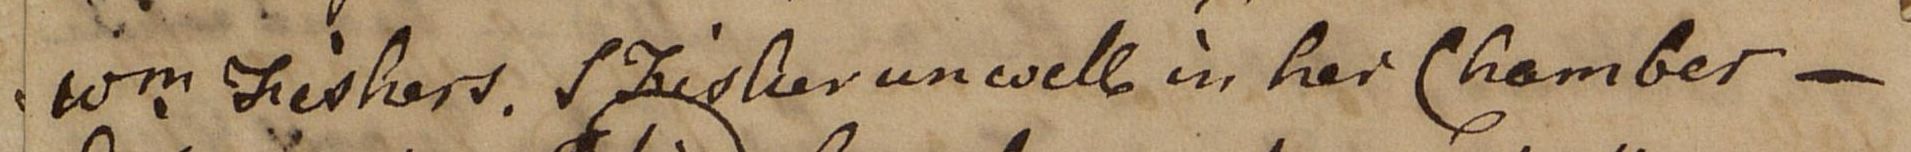W^m. Fishers, S Fisher unwell in her Chamber-
